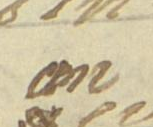an
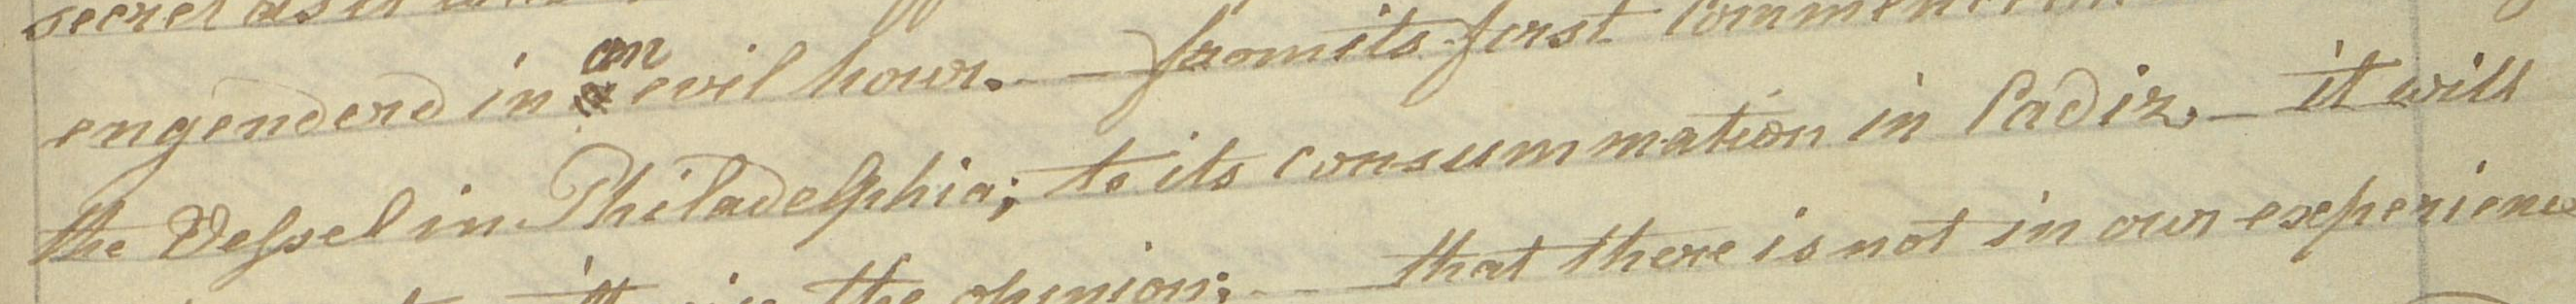the Vessel in Philadelphia; to its consummation in Cadiz, it will
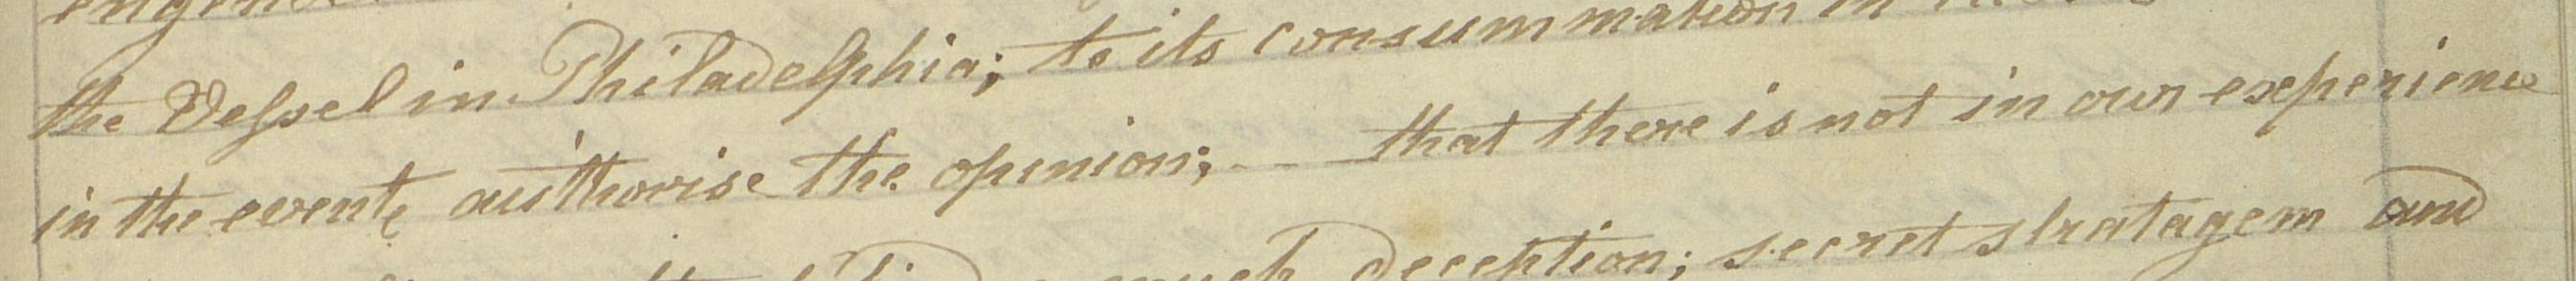in the event authorise the opinion; that there is not in our experience
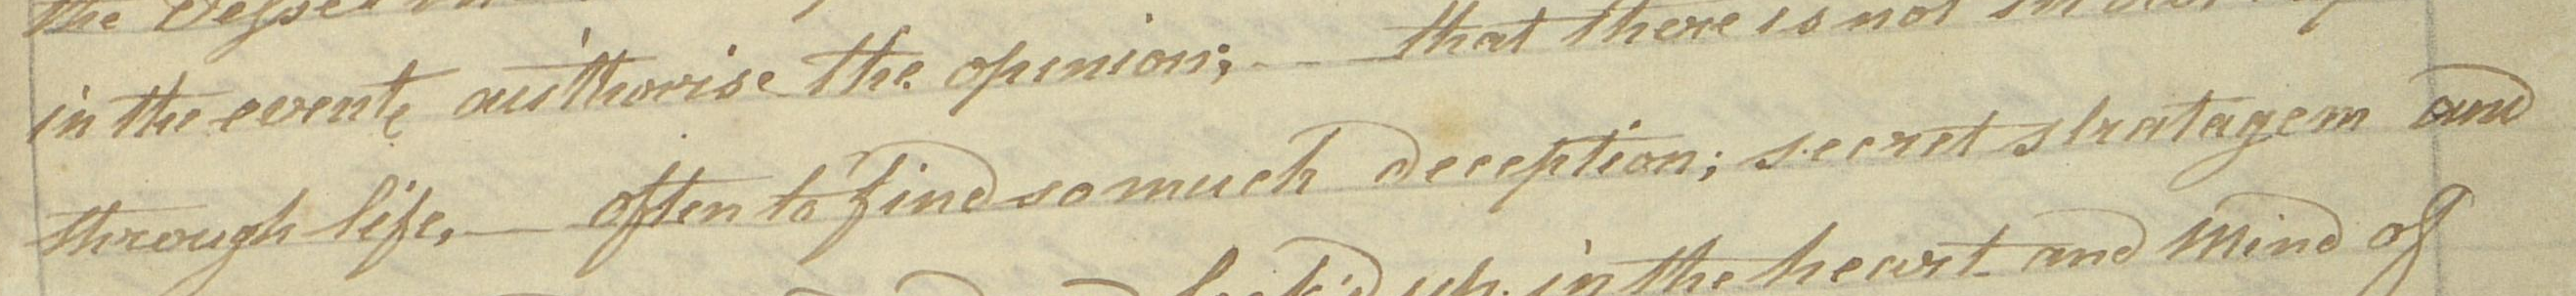through lie, often to find so much deception; secret stratagem and
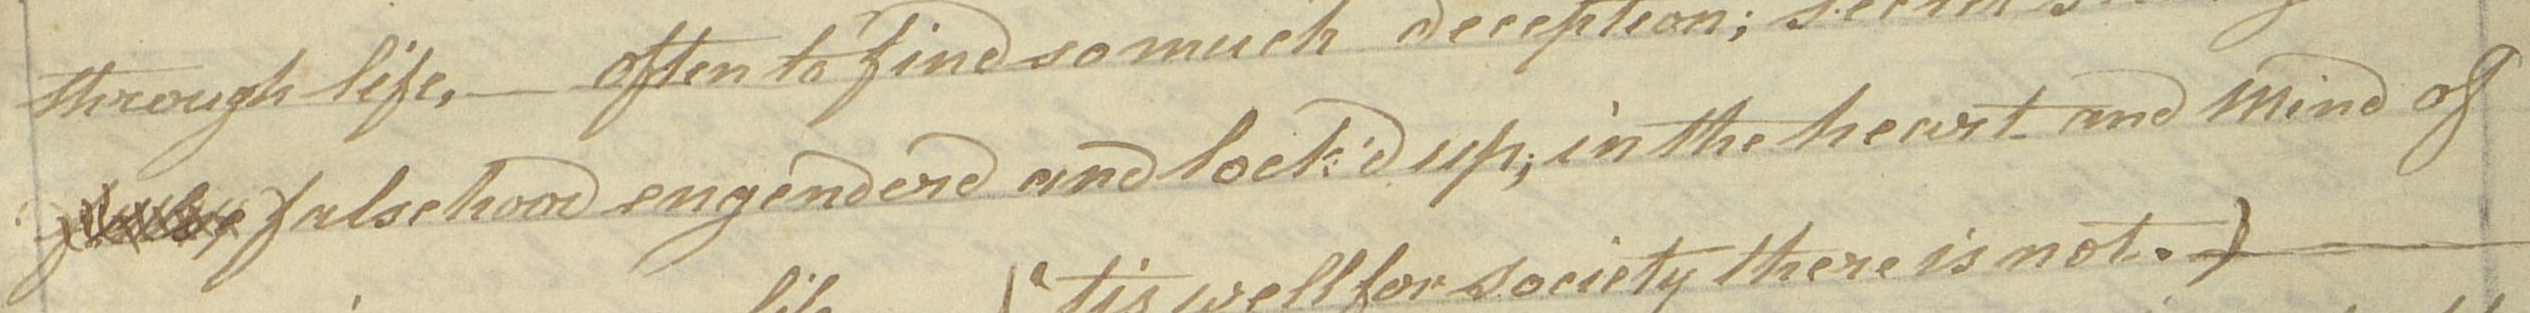[false] falsehood engendered and lock'd up; in the heart and Mind of
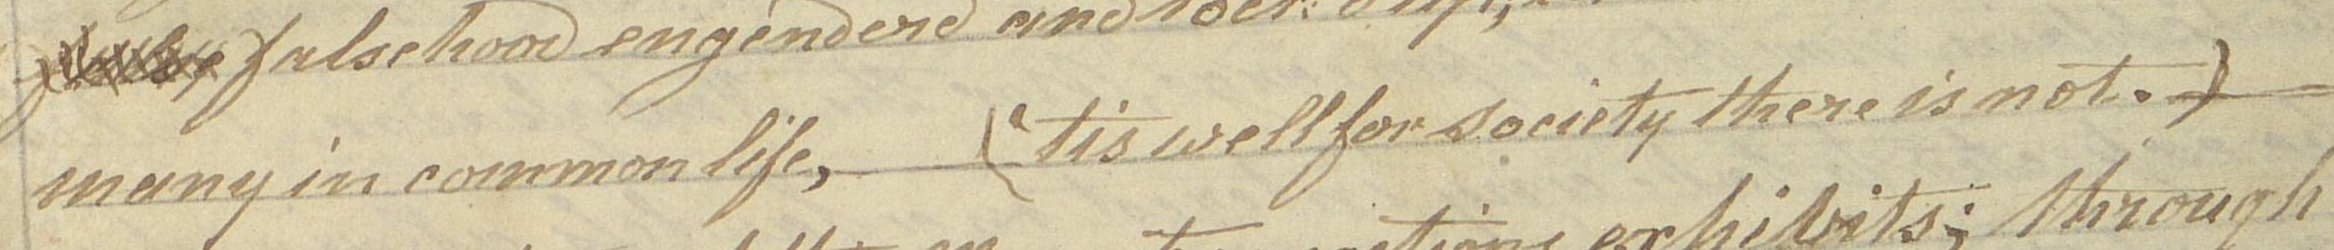many in common life, ('Tis well for society there is not.)
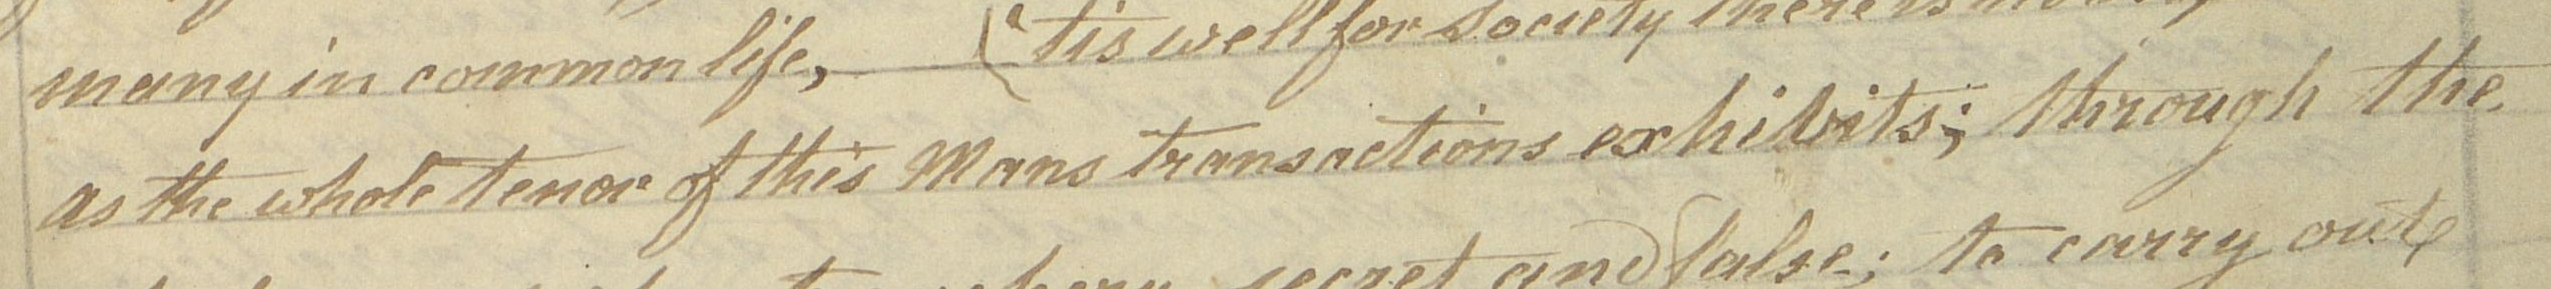as the whole tenor of this Mans transactions exhibits; through the
